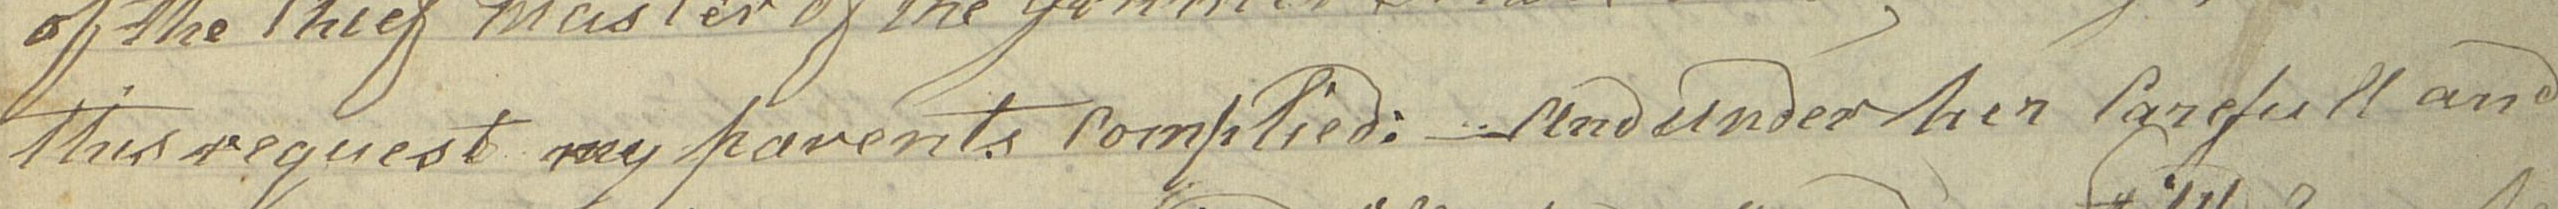this request my parents complied: and under her Carefull and
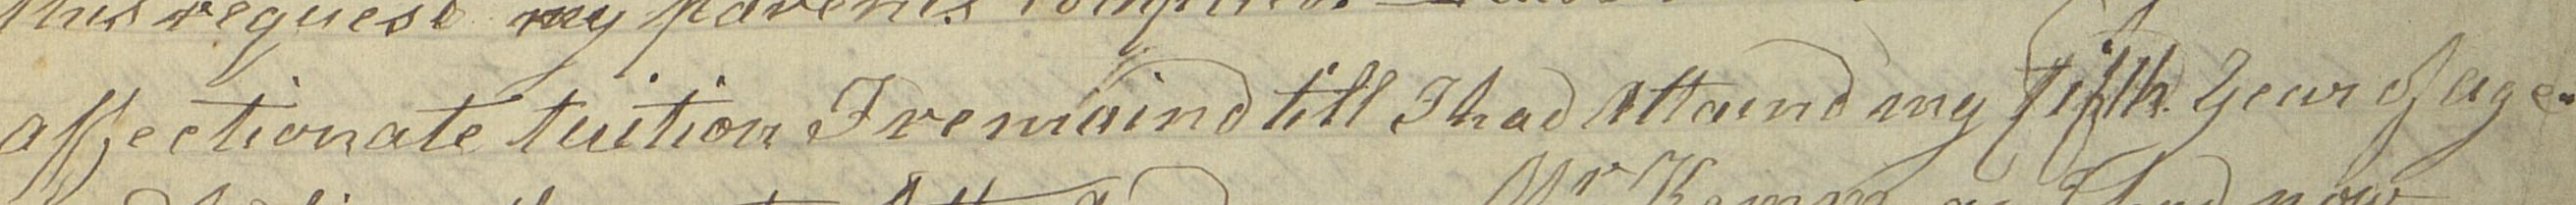affectionate tuition I remaind till I had attaind my fifth Year of Age.
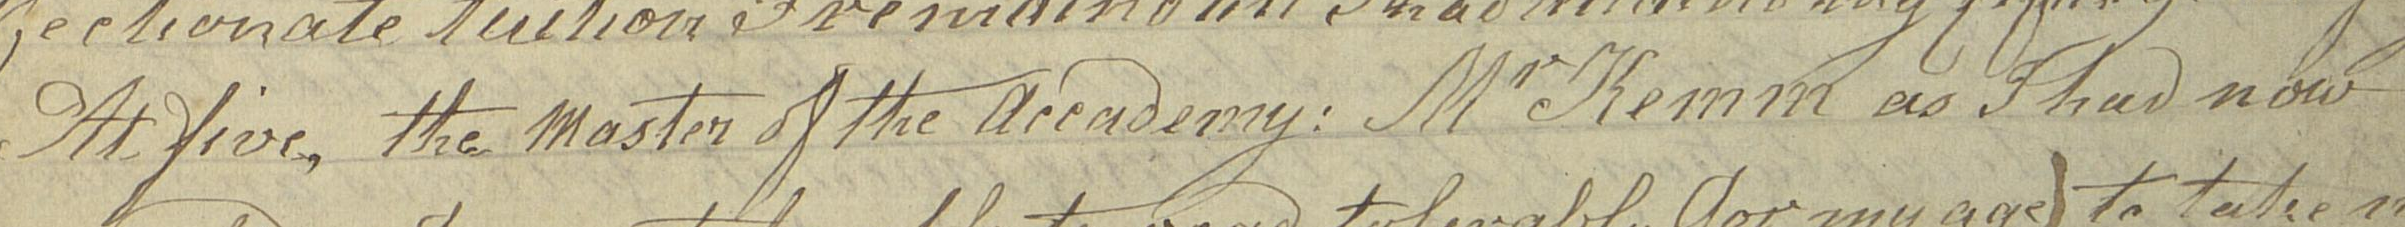At five, the Master of the Academy: M^r Kemm as I had now
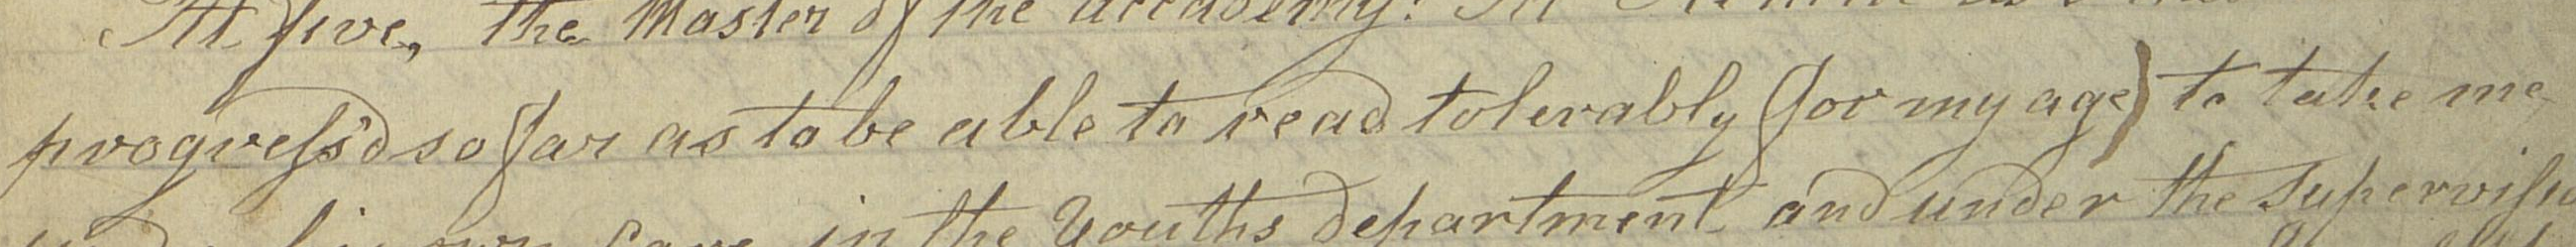progress'd so far as to be able to read tolerably (for my age) to take me
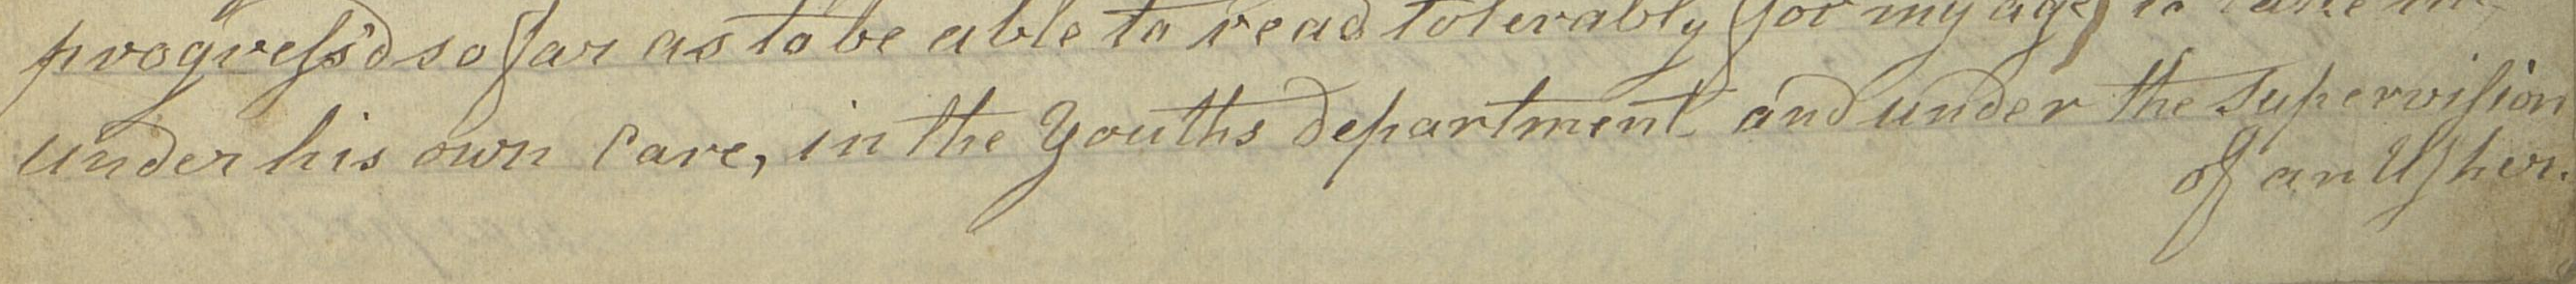under his own Care, in the youths department and under the Supervision
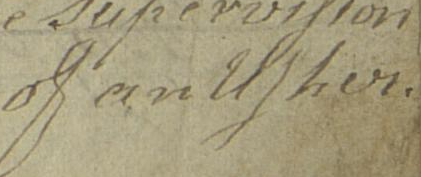of an Usher.
